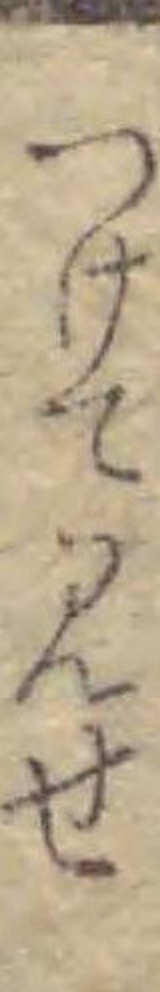つけてみせ
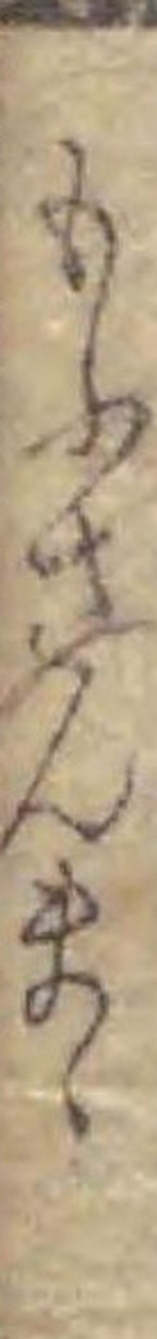もふさんまゝ
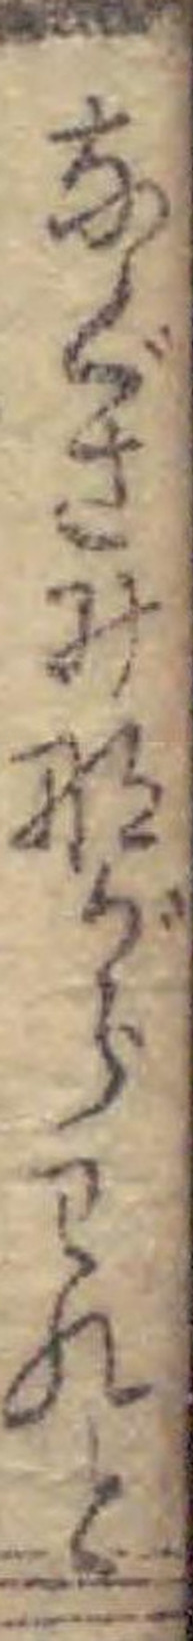なぐさみながらわれと
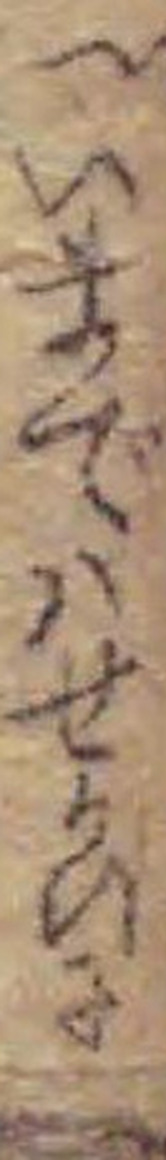〽いまではせかいに
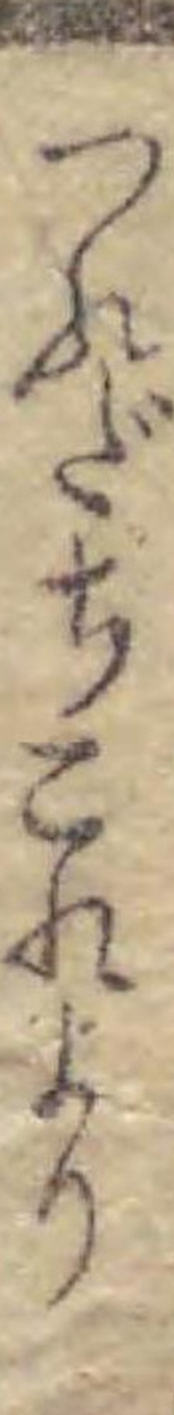つれだちこれより
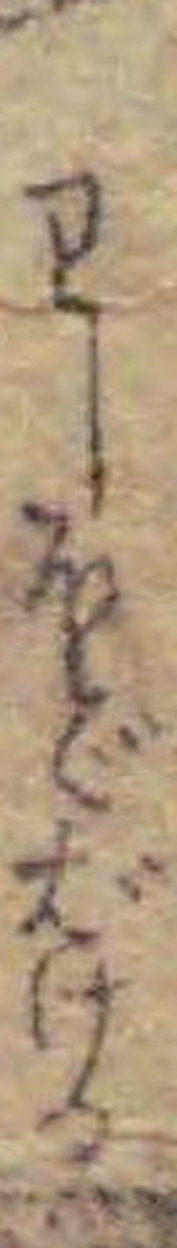わしほどばける
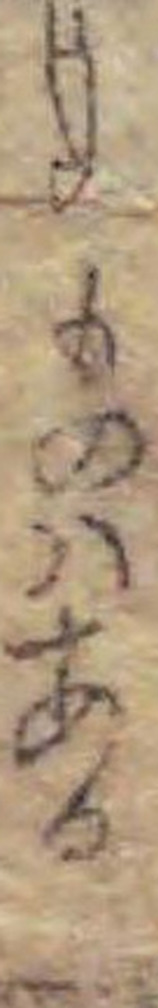ものはある
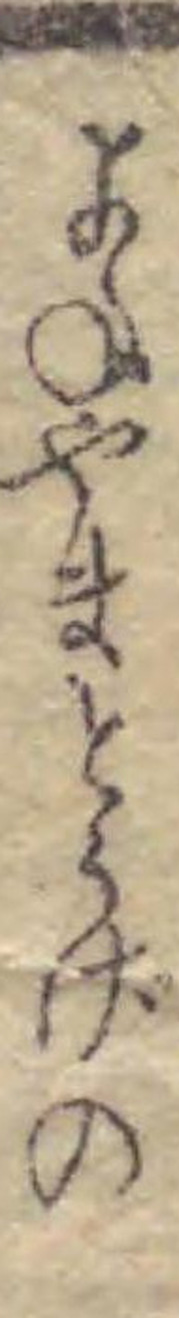よねやまとうげの
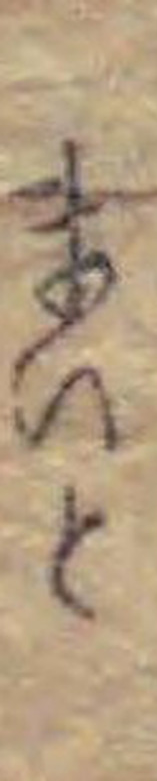まいと
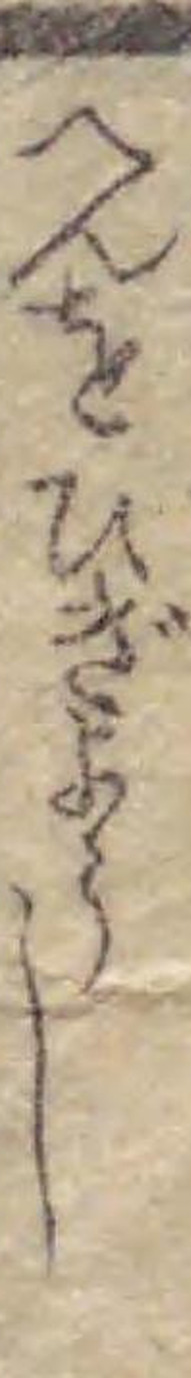へんをひぎようし
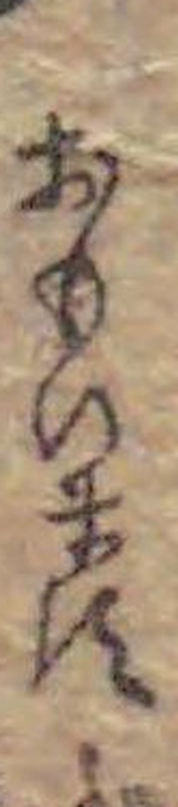おもいます
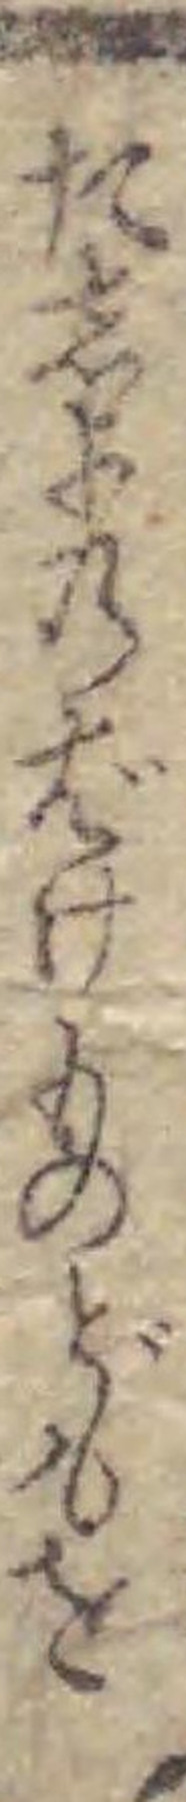たしよのばけものどもを
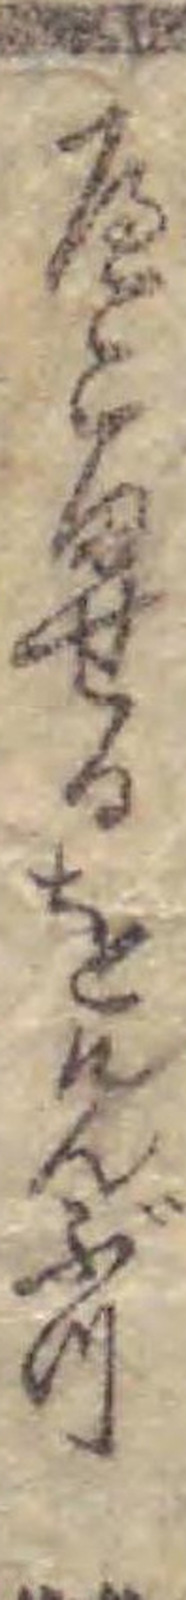へこませるをけんぶつ
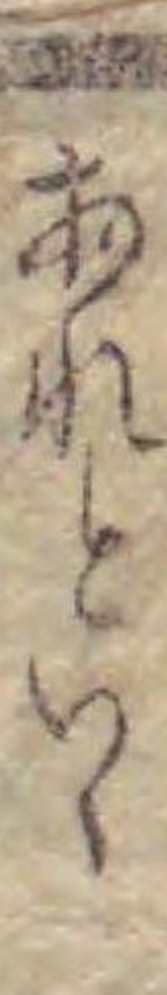あれといゝ
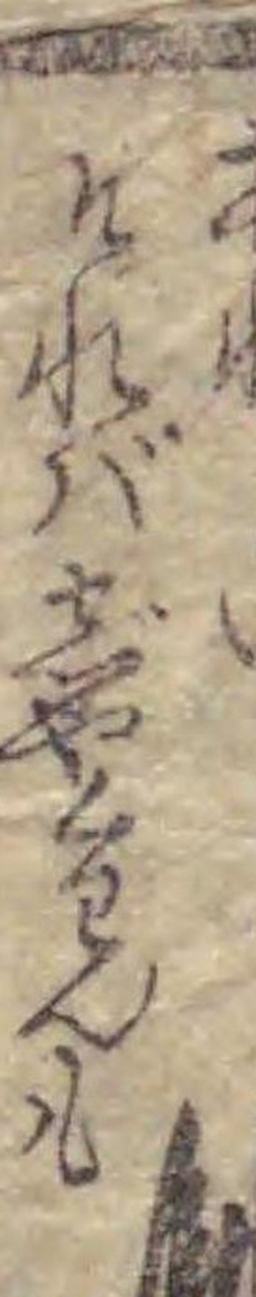ければじやくわんも
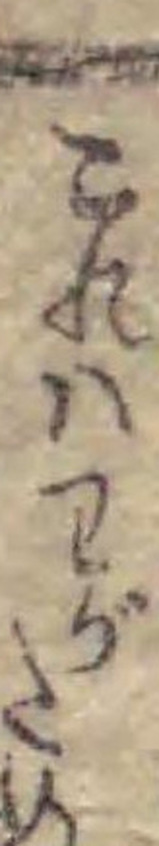これはわがため
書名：化物世界夜半嵐 : 3巻
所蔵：国立国会図書館 National Diet Library, JAPAN
